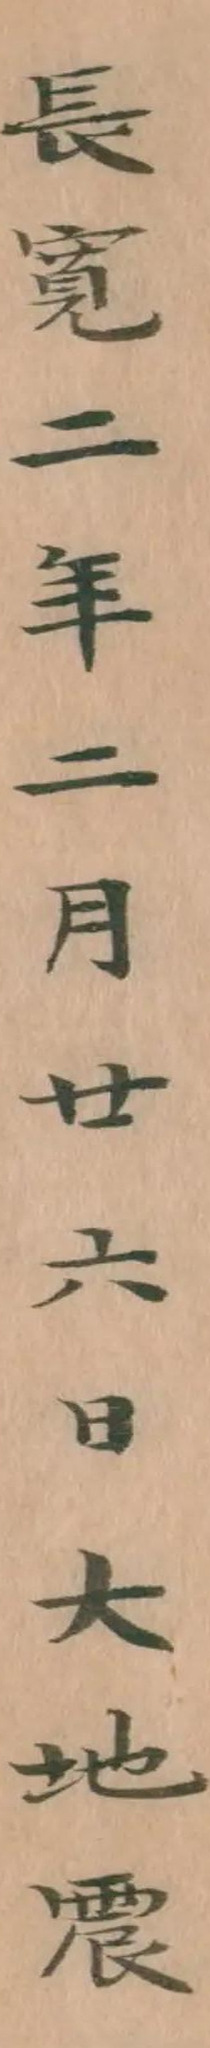長寛二年二月廿六日大地震
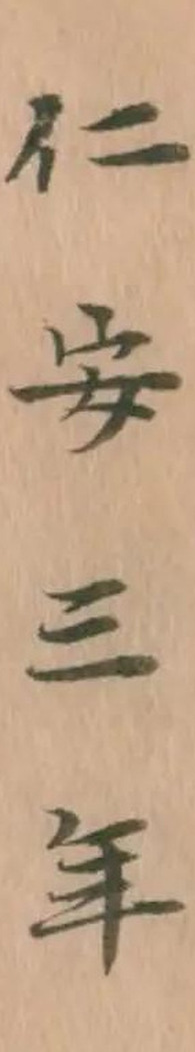仁安三年
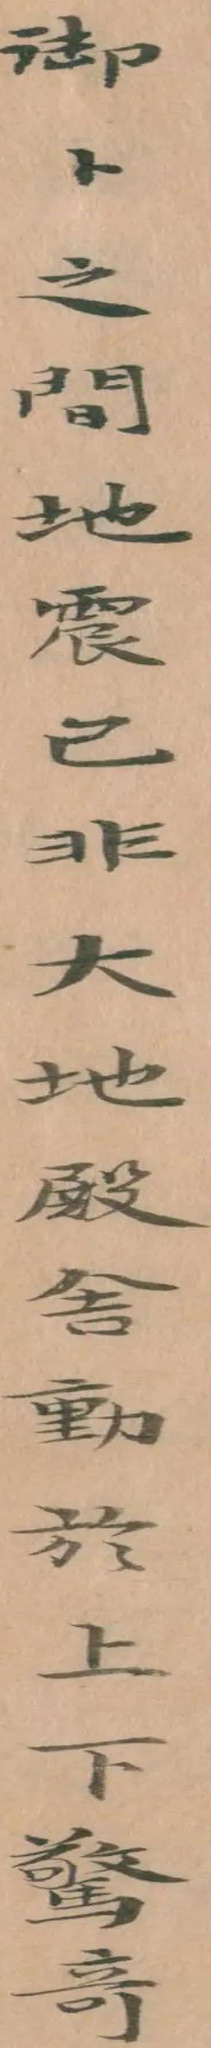御卜之間地震已非大地殿舎動於上下驚奇

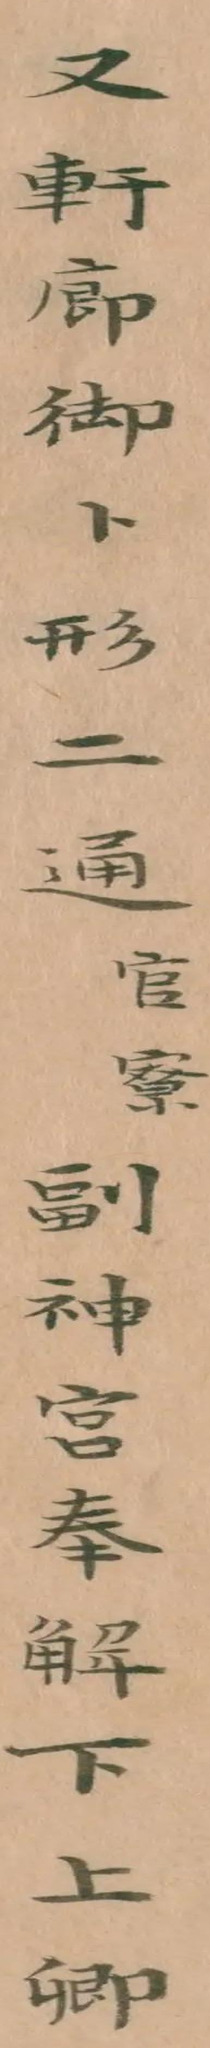又軒廊御卜形二通官寮副神宮奉解下上卿
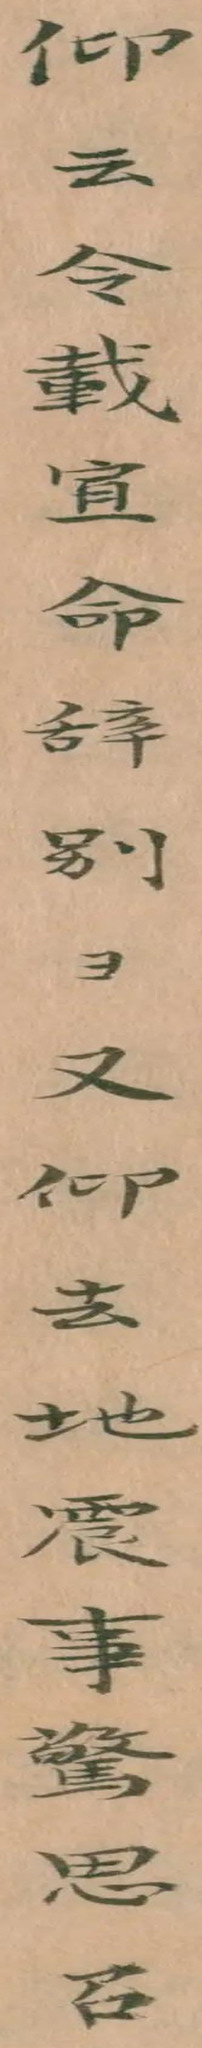仰云令載宣命辞別ヨ又仰去地震事驚思召
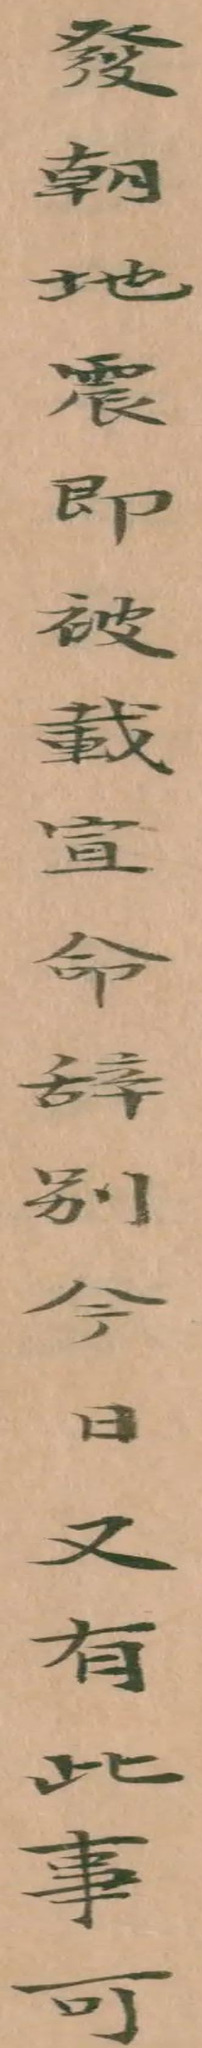発朝地震即被載宣命辞別今日又有此事可
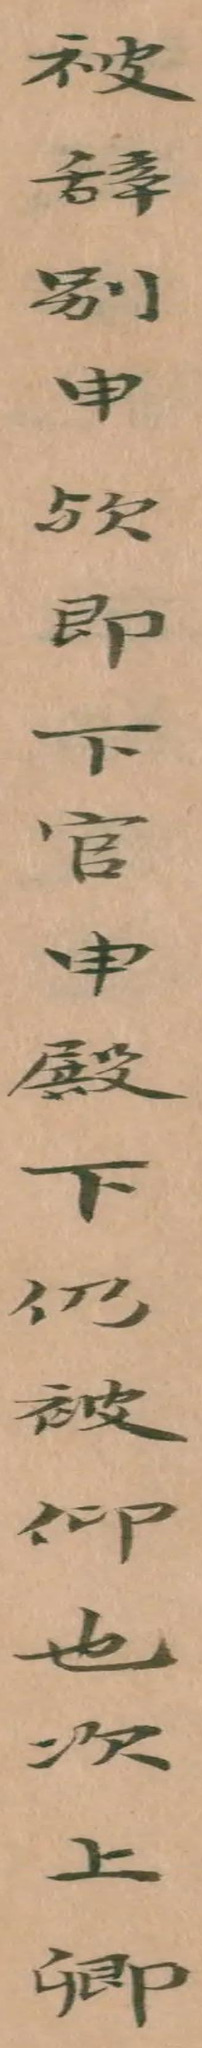被辞別申歟即下官申殿下仍被仰也次上卿
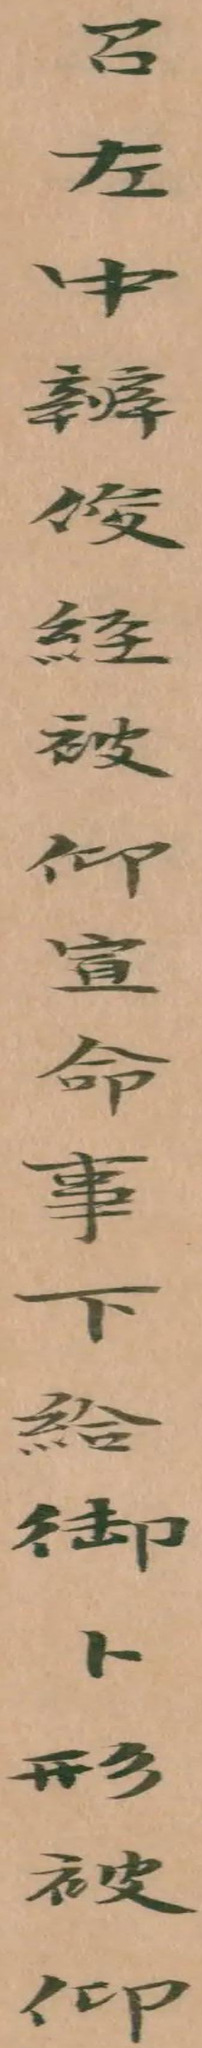召左中弁俊経被仰宣命事下給御卜形被仰
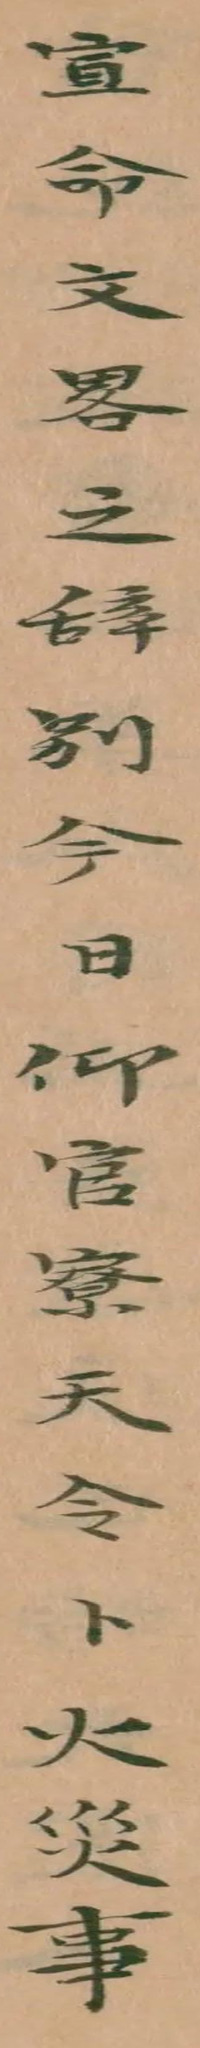宣命文略之辞別今日仰官寮天令卜火災事
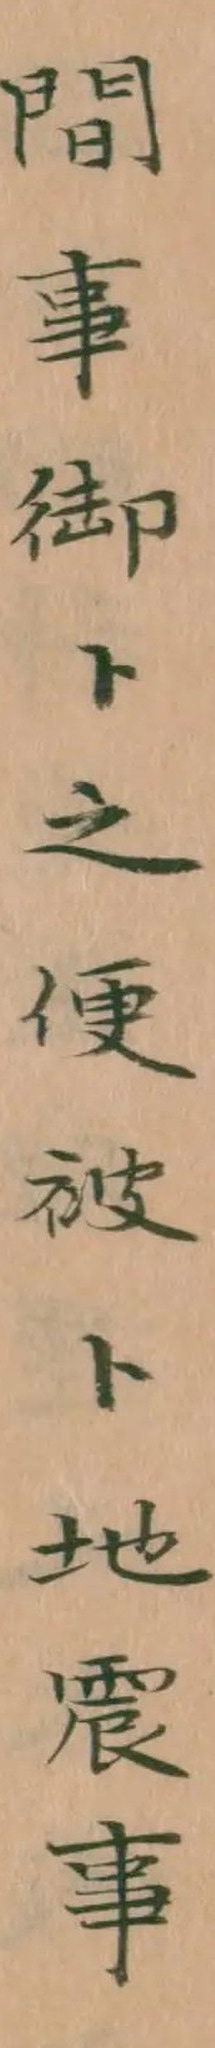間事御卜之便被卜地震事
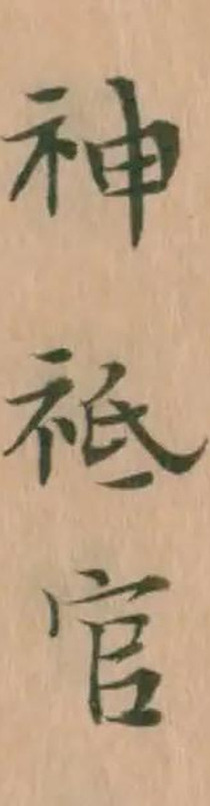神祗官
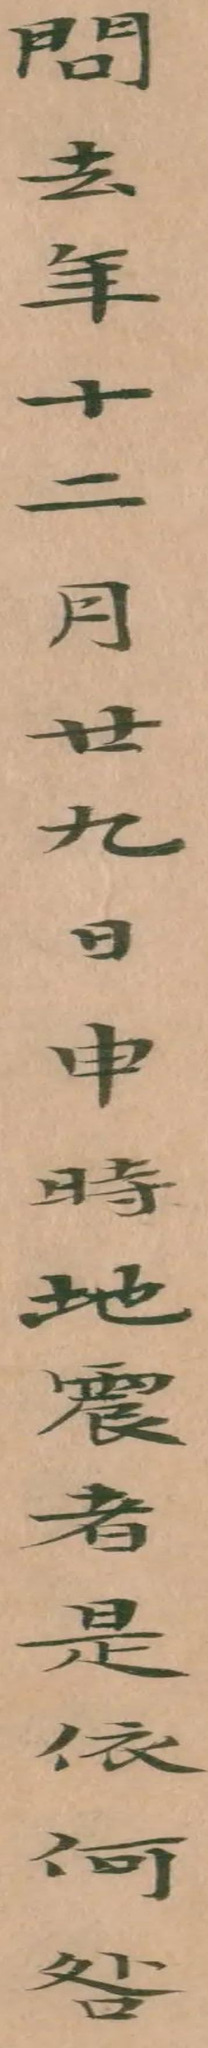問去年十二月廿九日申時地震者是依何咎
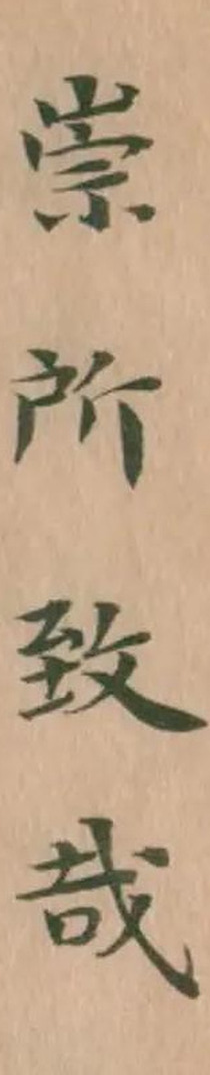祟所致哉
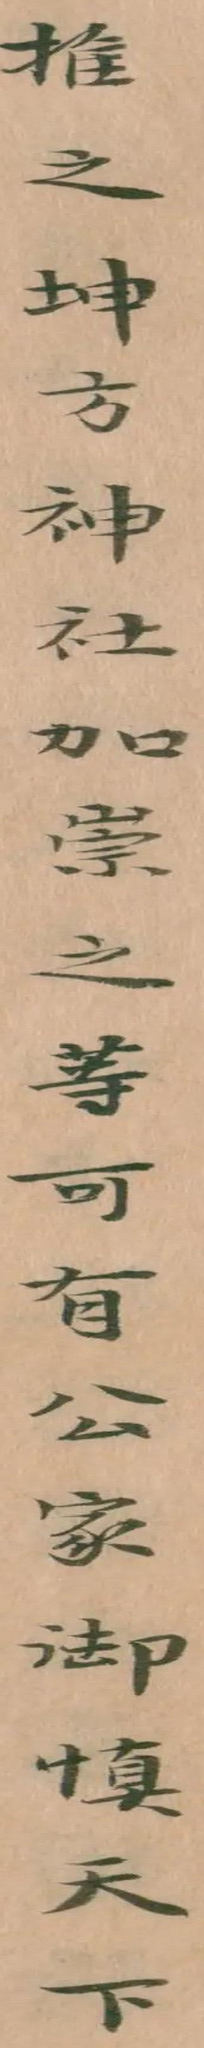推之坤方神社加祟之等可有公家御慎天下
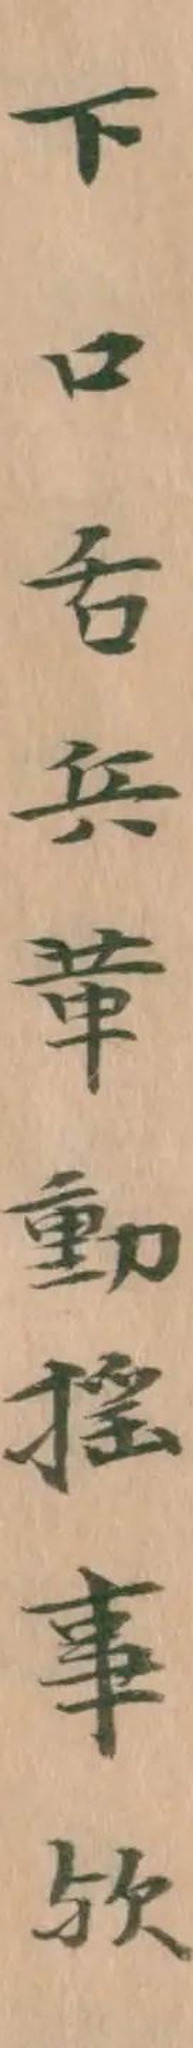下口舌兵革動揺事歟

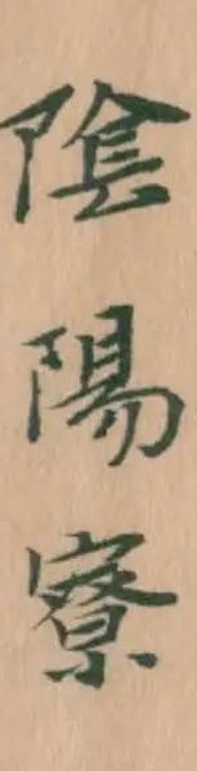陰陽寮
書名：地災撮要. 巻5-6(地震之部)
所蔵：国立国会図書館 National Diet Library, JAPAN
